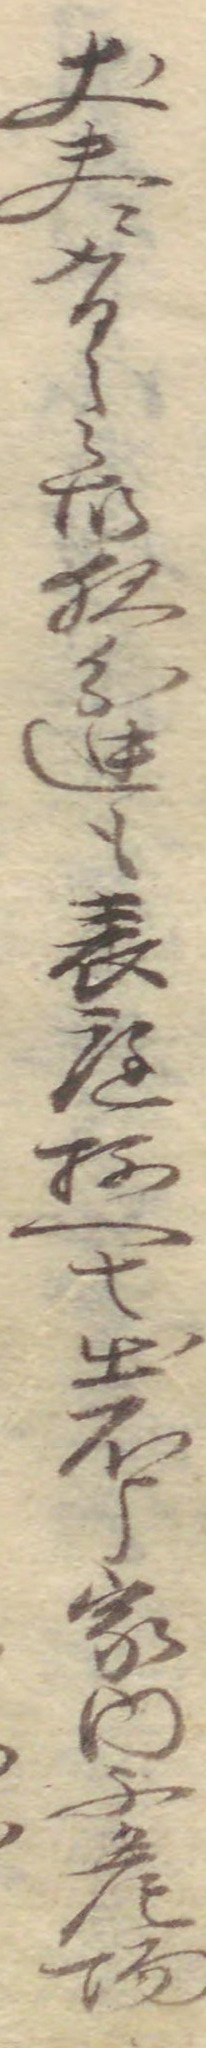丈夫ニ有之候故夜分迚も表庭抔へは出不申家内不危場
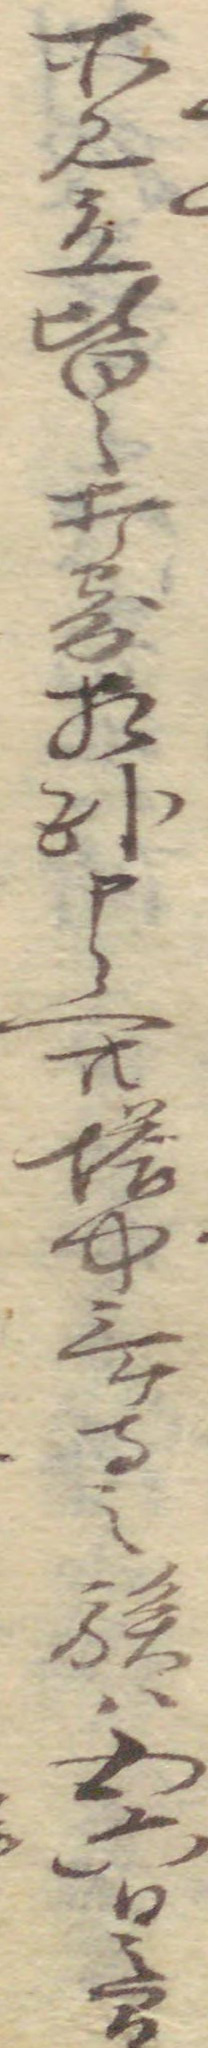所見立皆〻打寄相眠申候へ共塔中三ケ寺之族ハ五六日之間
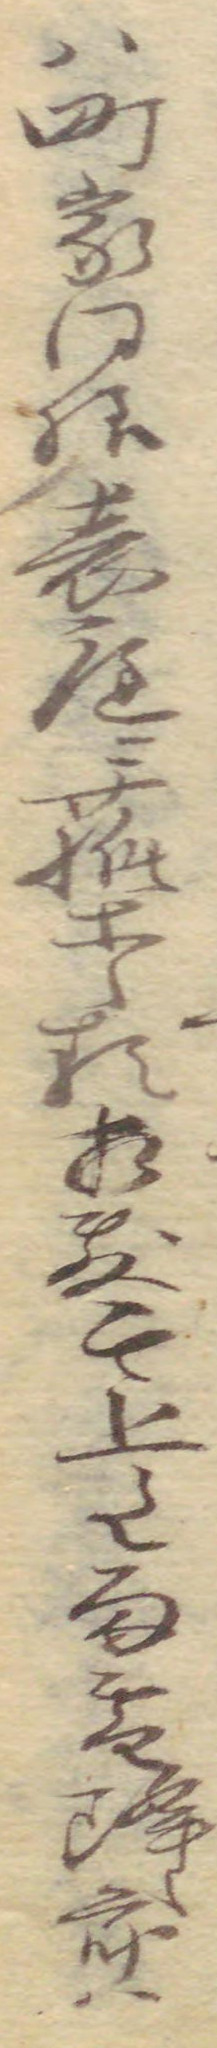ハ町家同様表庭ニ菰等之類相敷其上ニて雨雪降候節ハ

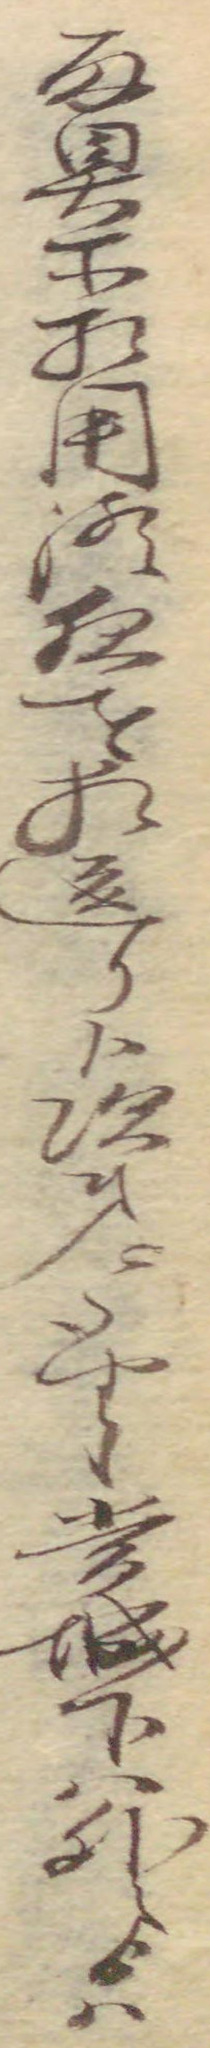雨具等相用終夜を相送り候次第ニ御座候当城下ハ外ゟハ
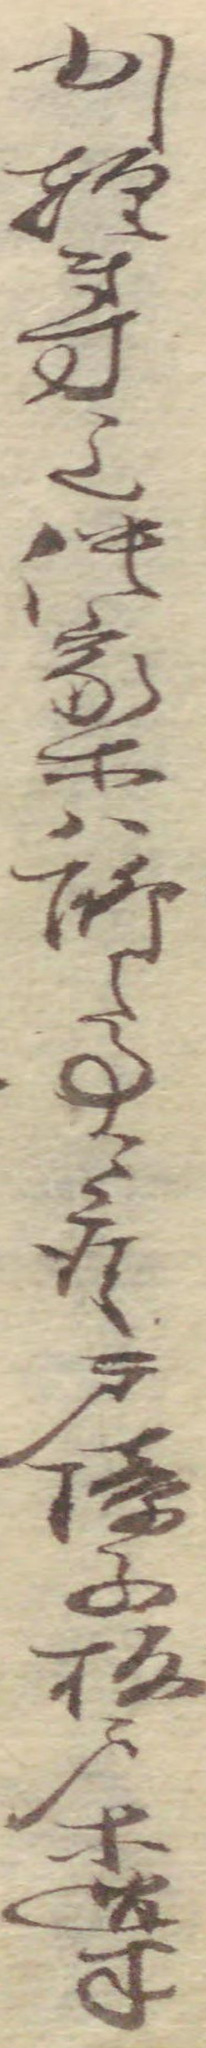少し軽き方ニて潰家等ハ聊之事ニ御座候戸障子板戸等過半
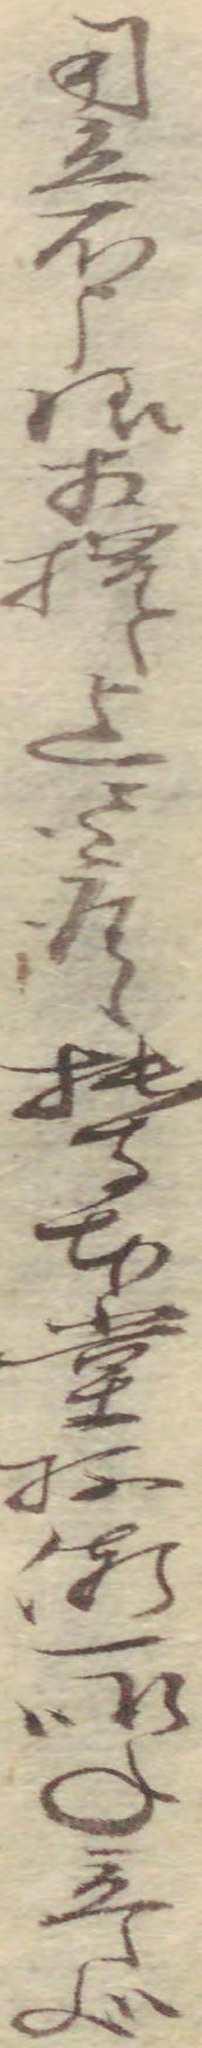用立不申様相摧候迄ニ御座候拙寺本堂抔漸一昨年立候処
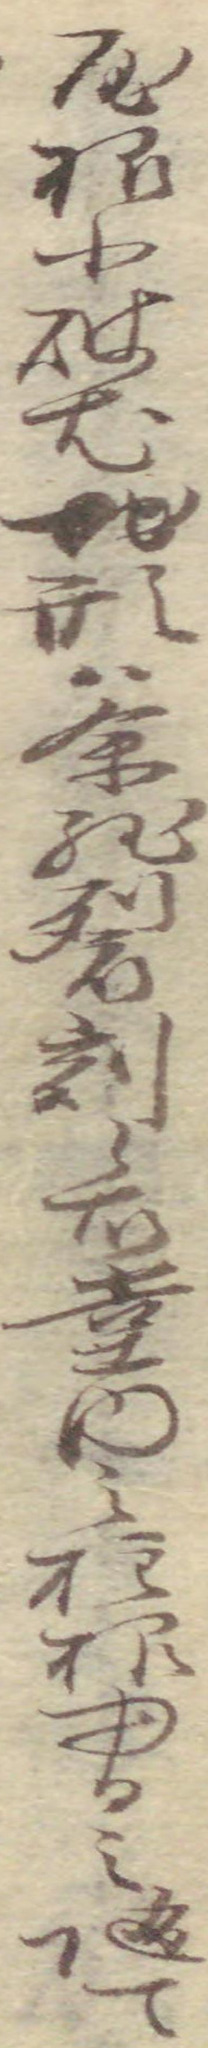屋根小破尤地形ハ余程裂割候右堂内之柱根ゆるミ随て
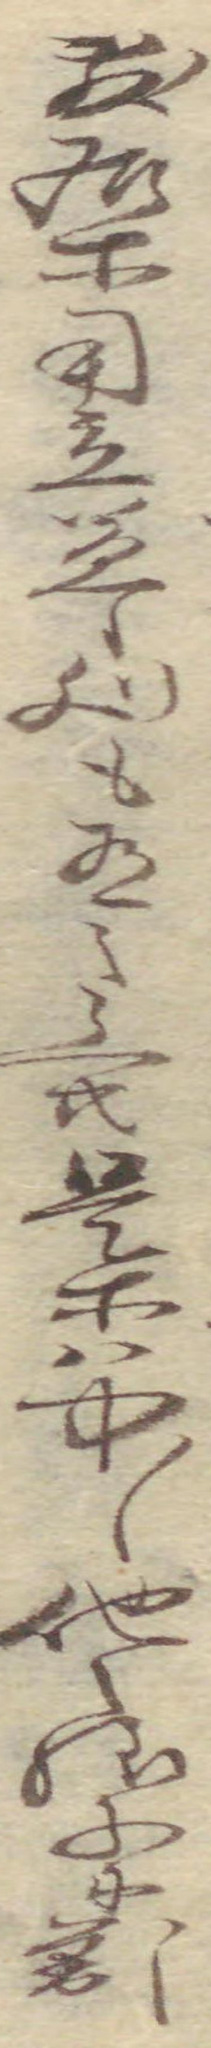敷居抔用立兼候処も有之候へ共是等ハ中〳〵他之様子に対
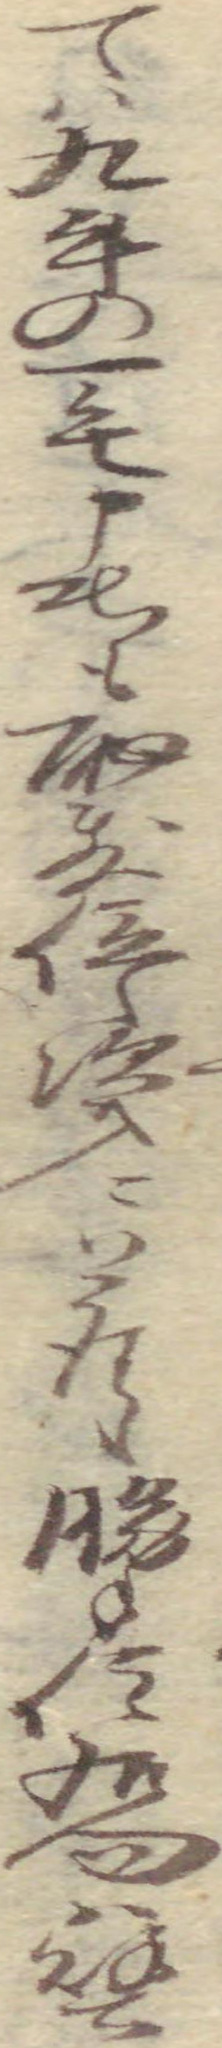てハ九牛の一毛申出も恥敷位之次第ニ御座候勝手住居向きハ壁
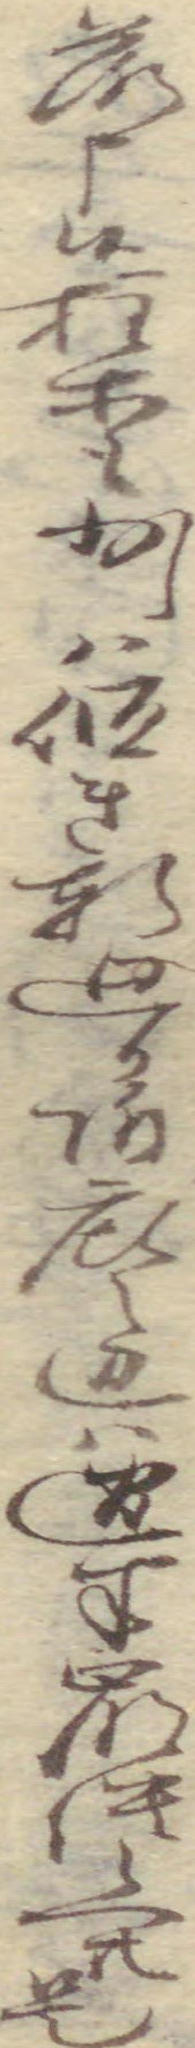落申候柱等も少しハ傾き軒廻り附庇の辺ハ過半崩潰候へ共是
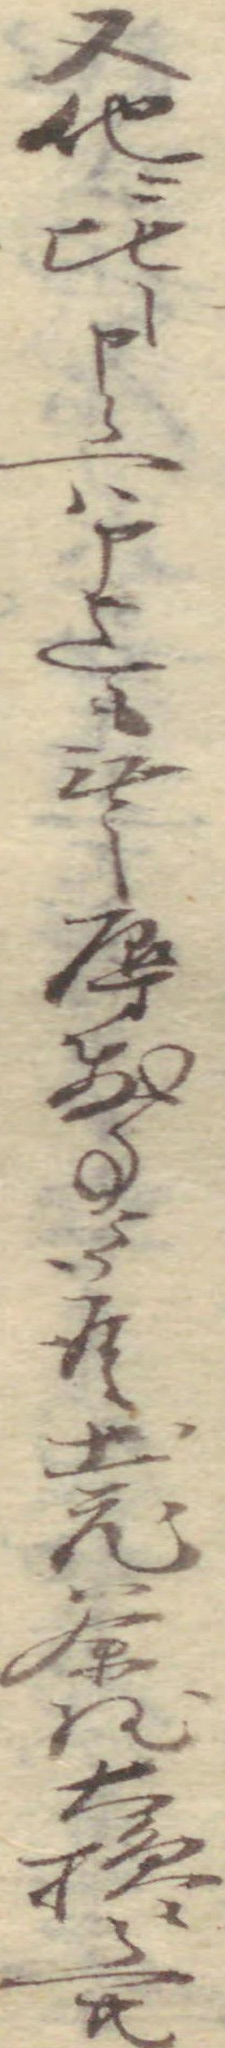又他ニ比し申候へハ申迄も無之辱敷事ニ御座候土蔵ハ余程大損ニ候へ共
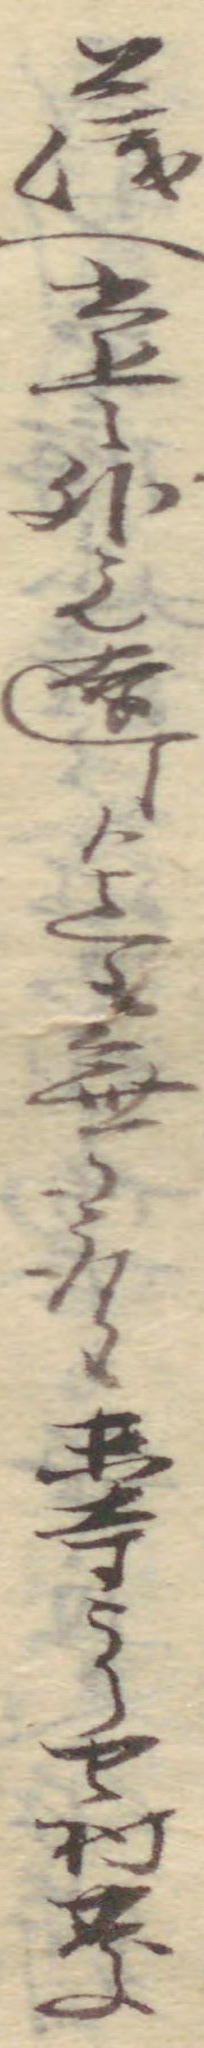公儀へ書上候外ニて達し候迄も無之御座候も末寺ニ候中村慶
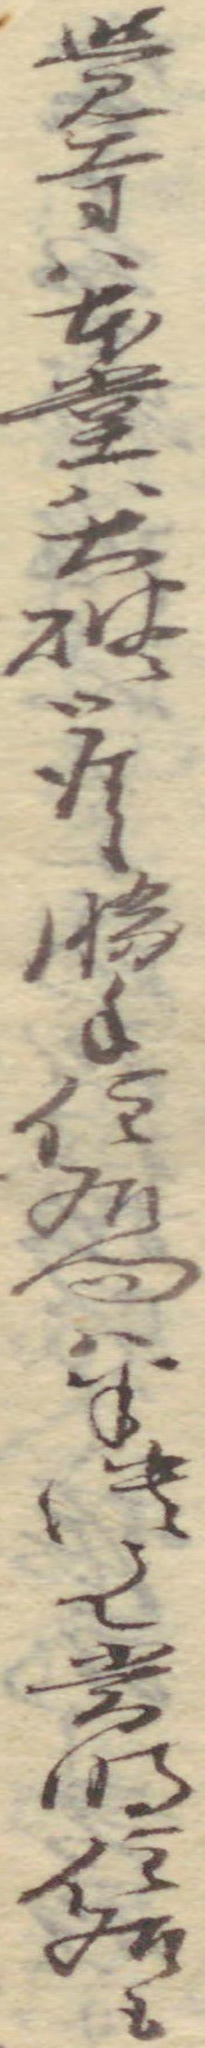覚寺ハ本堂ハ大破ニ御座候勝手住居向ハ半潰ニて常時住居も
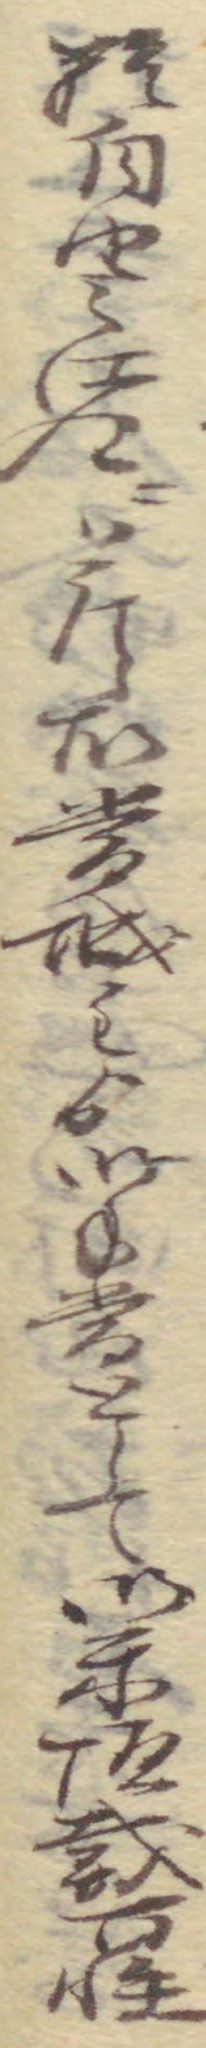難自由之仕合ニ御座候故当城主ゟ御手当として御米頂戴百性
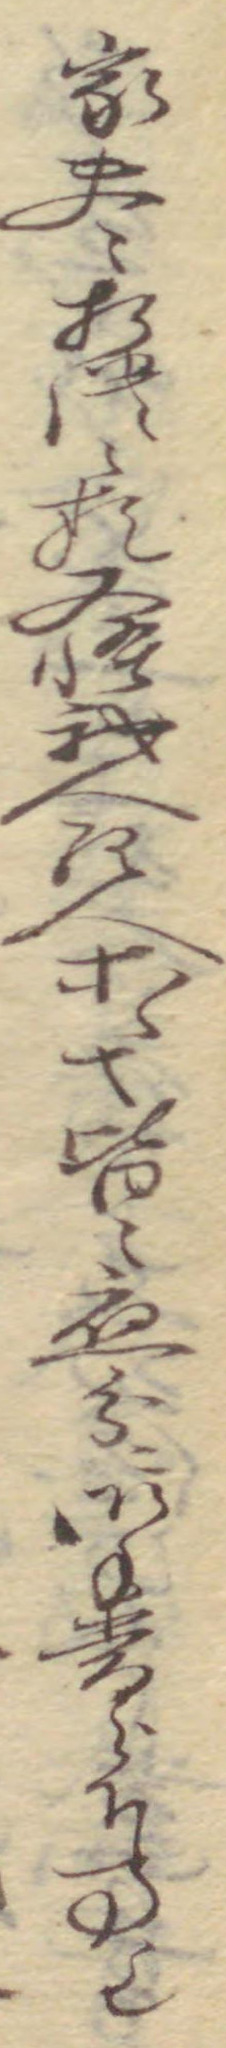家夫〻相潰之類又怪我人死人等〻は皆〻応分ニ御手当被下事ニて
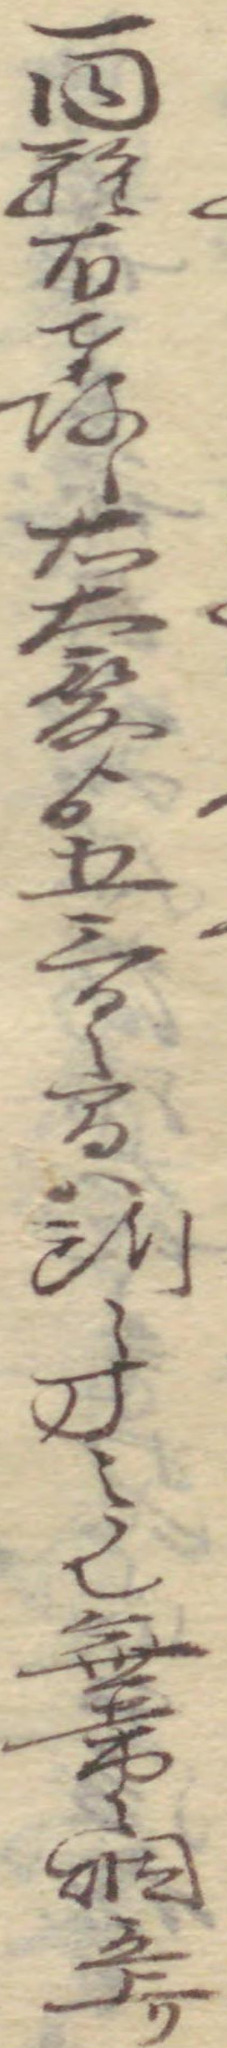一同難有奉存候右大変ゟ五三日之間ハ所〻方〻ニて無常之烟立上り
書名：鶯宿雑記. 巻199-200
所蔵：国立国会図書館 National Diet Library, JAPAN
